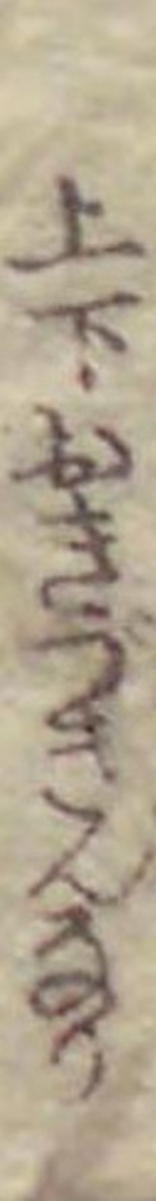上下おきづきんなり
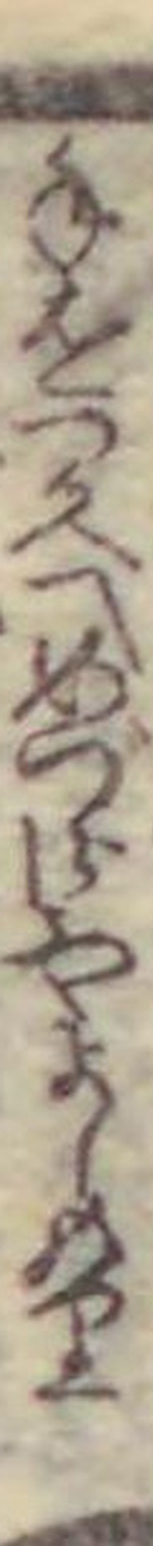手をつかへ〽めづらしやよしもり
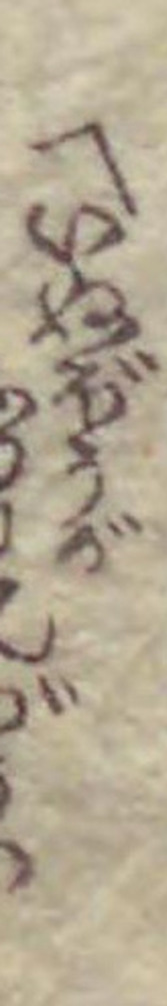〽いぬぼうが
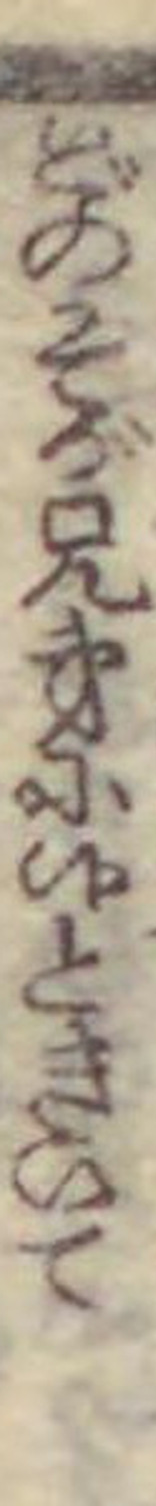どのそが兄弟に候ときいて
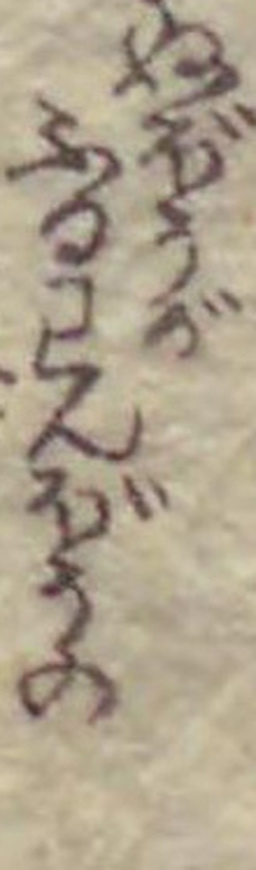ふるわんぼうの
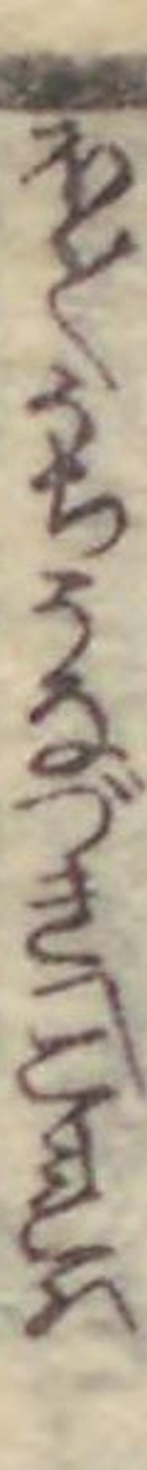ほく〳〵うちうなづき〽これは
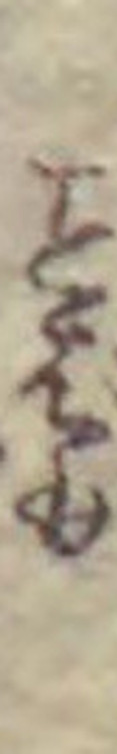ことばも
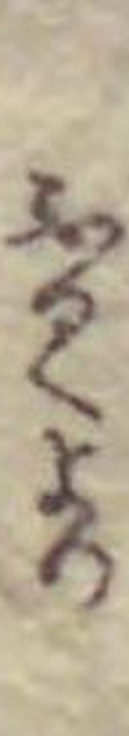ふるくより
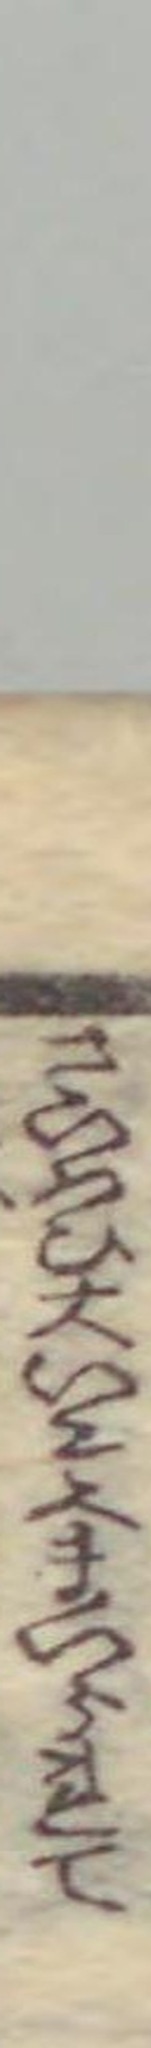さいはひ大いそへまいられて
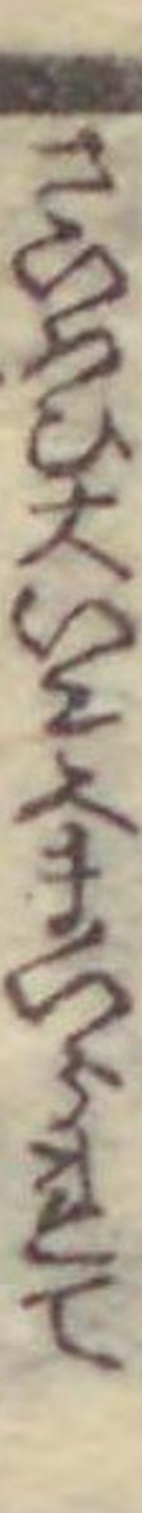さいはひ大いそへまいられて
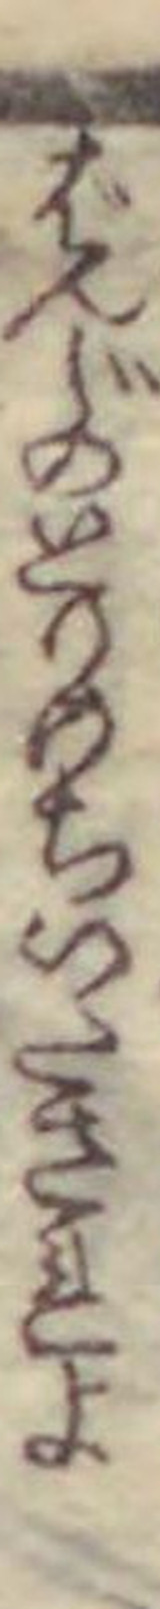ばんじのとりもちいたされよ
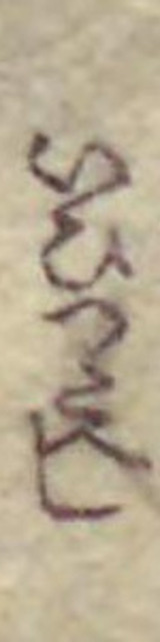いひつたへし
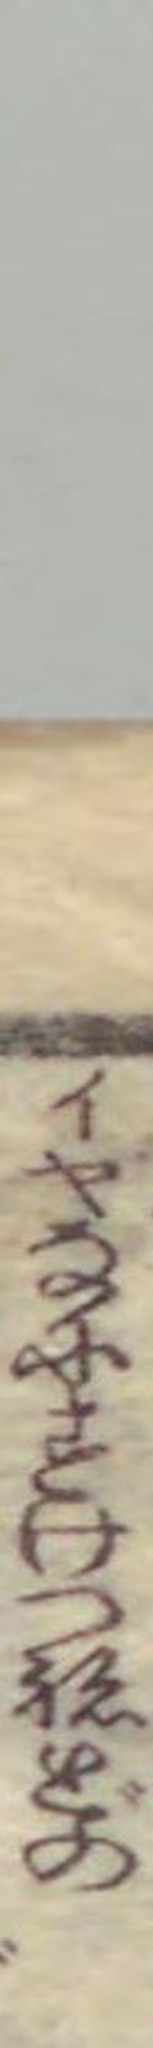イヤなにすけつねどの
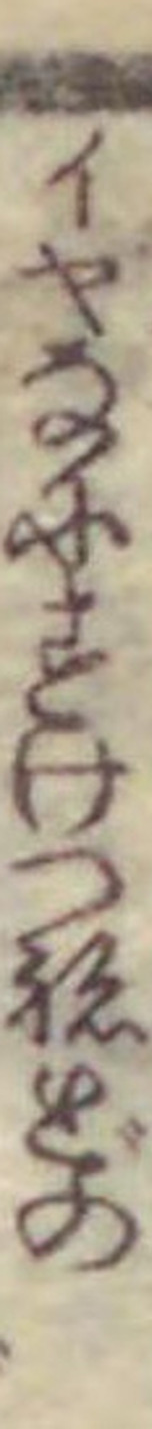イヤなにすけつねどの
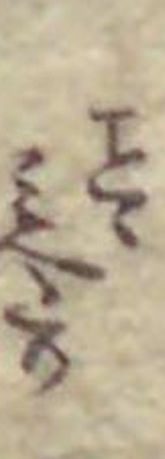ことゝ
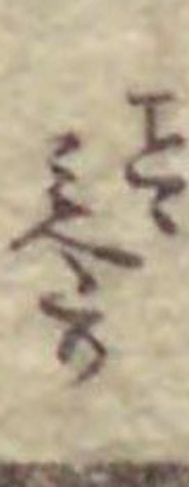ことゝ
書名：大時代唐土化物 3巻. 曽我太夫染
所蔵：国立国会図書館 National Diet Library, JAPAN
